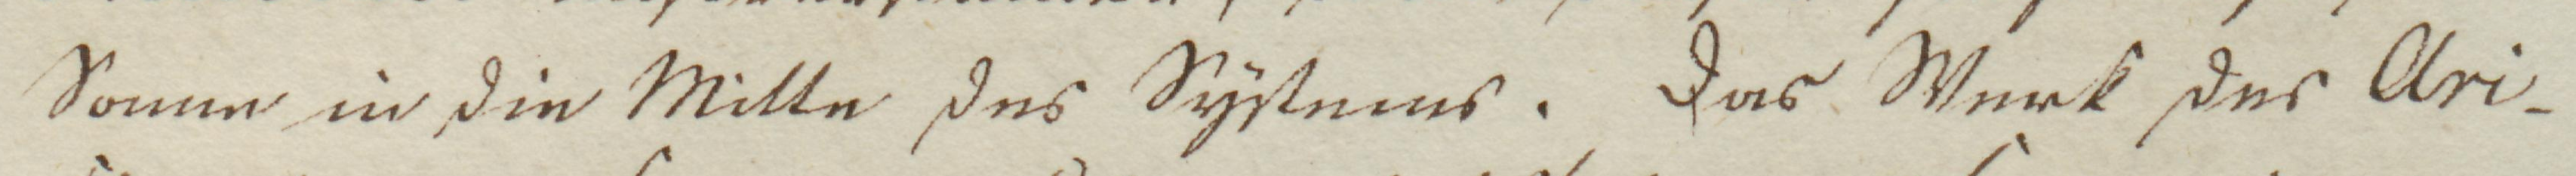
Sonne in die Mitte des Sÿstems. Das Werk des Ari-
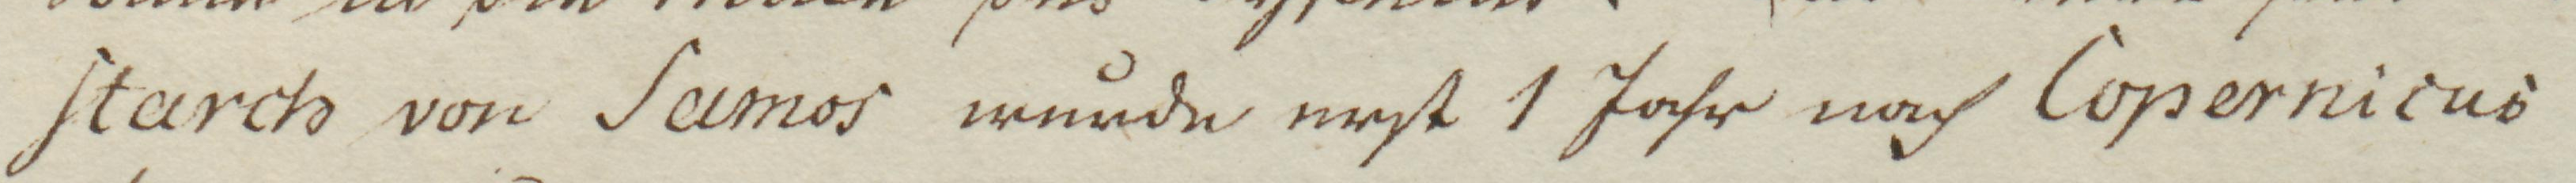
starch von Samos wurde erst 1 Jahr nach Copernicus
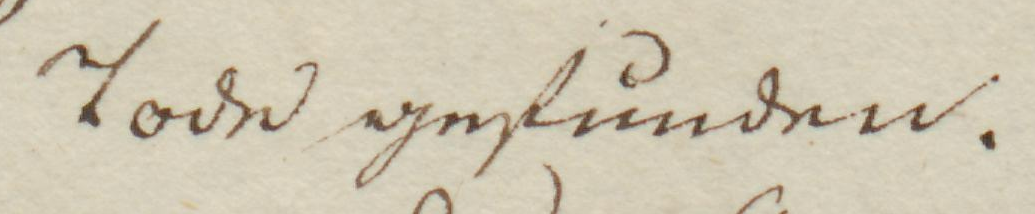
Tode gefunden.
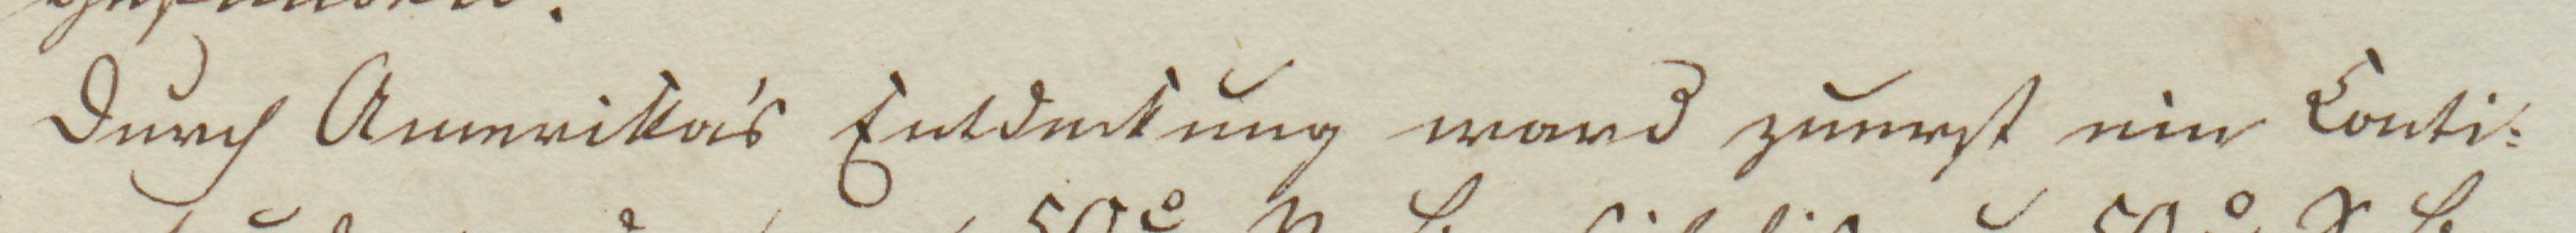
Durch Amerika's Entdeckung ward zuerst ein Conti-
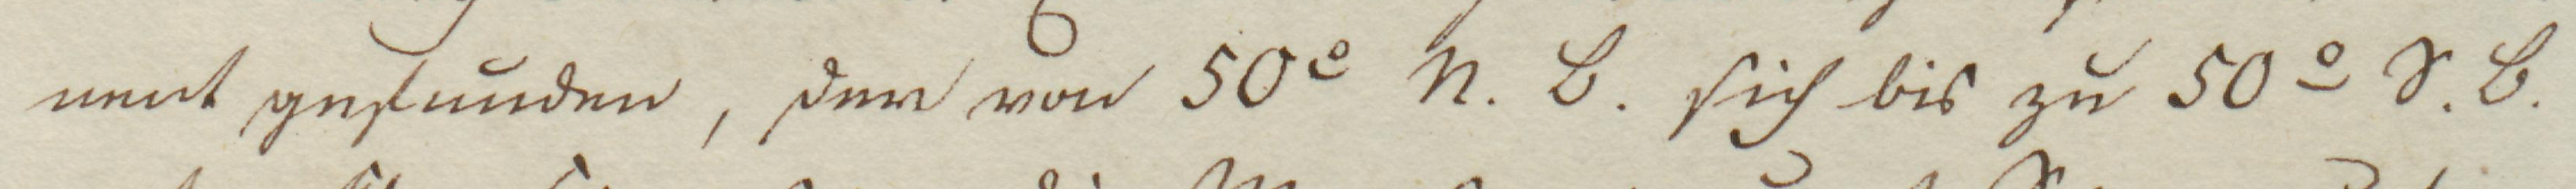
nent gefunden, der von 50° N. B. sich bis zu 50° S. B.
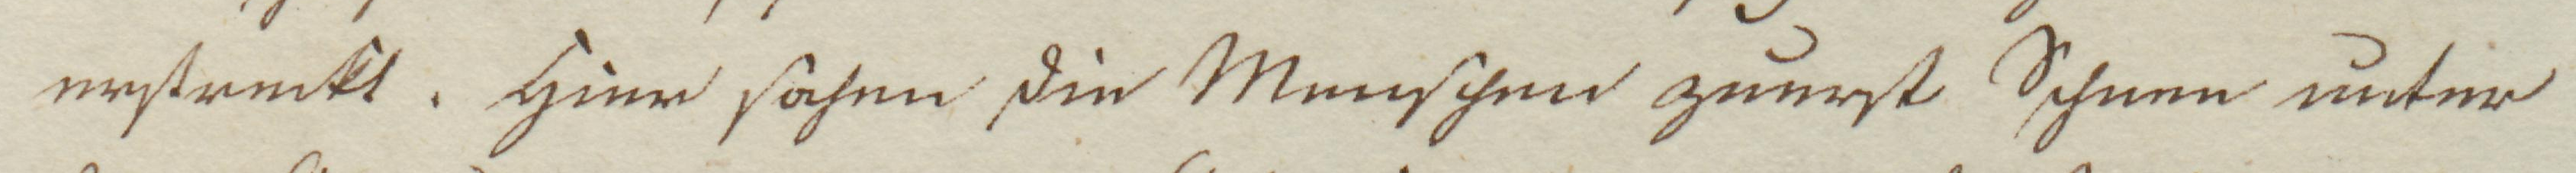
erstreckt. Hier sahen die Menschen zuerst Schnee unter
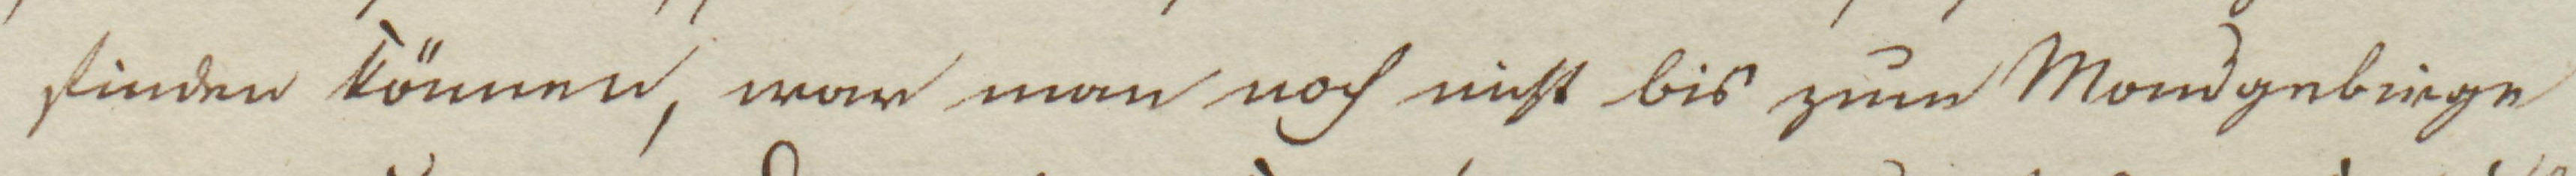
finden können, war man noch nicht bis zum Mondgebirge
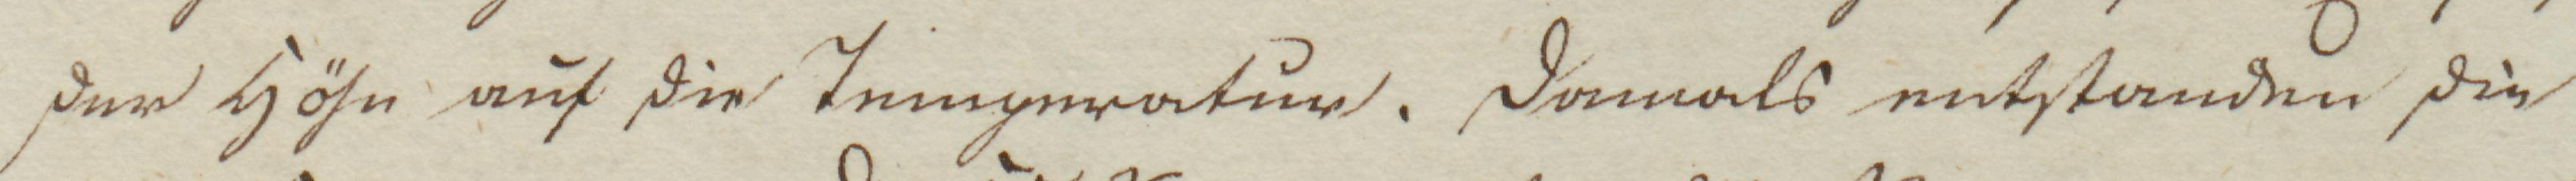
der Höhe auf die Temperatur. Damals entstanden die
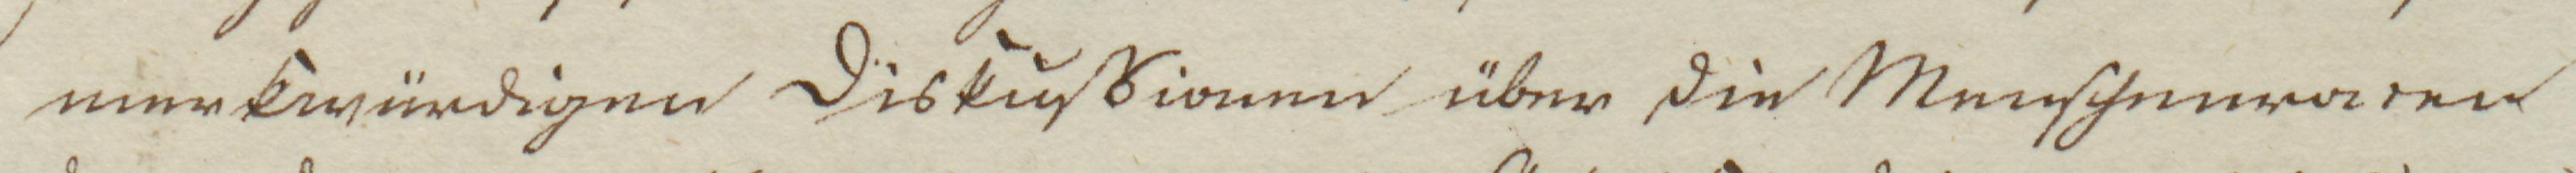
merkwürdigen Diskußssionen über die Menschenracen
